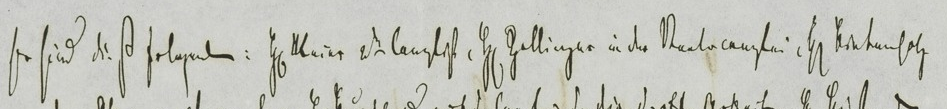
sind dieß folgende: Herr Meier 2t Canzlist, Herr Zollinger
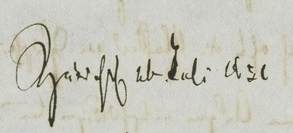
Herr Bietenholz
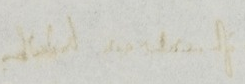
Arbeiten, Herr Hiestand
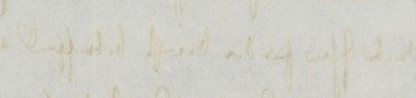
in der Obergerichtscanzlei,
